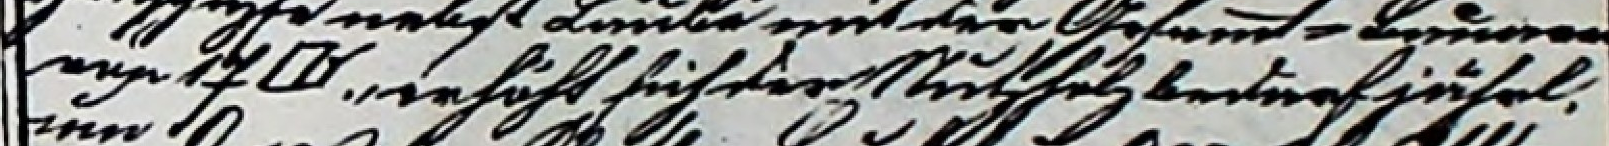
nen 17 Ck., erhöht sich der Nutzholz bedarf jährl,
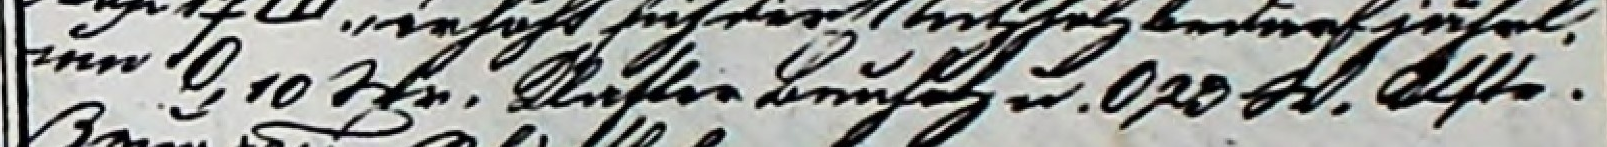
um 0,10 Wr. Klafter Bauholz u. 0,23 W. Klftr.
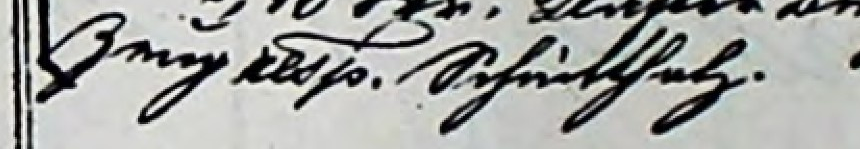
Zeug resp. Schnittholz.
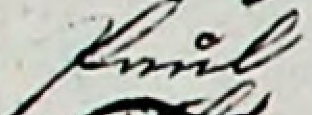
Paul
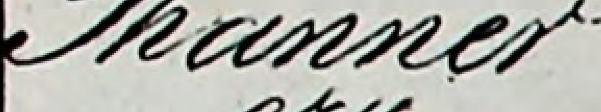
Thanner
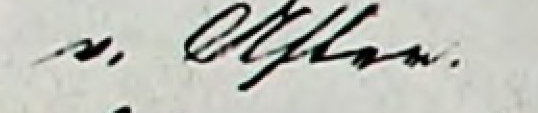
v. Aster
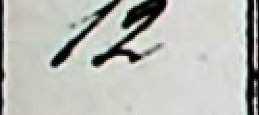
12
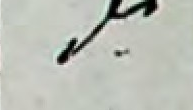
do
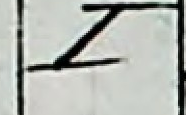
I
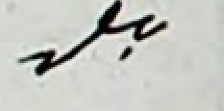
do
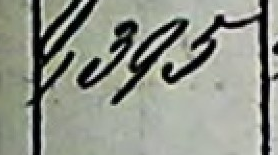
0,395
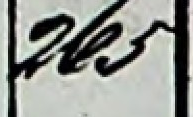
265
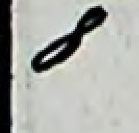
8
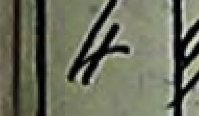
4
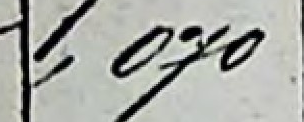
1,070
